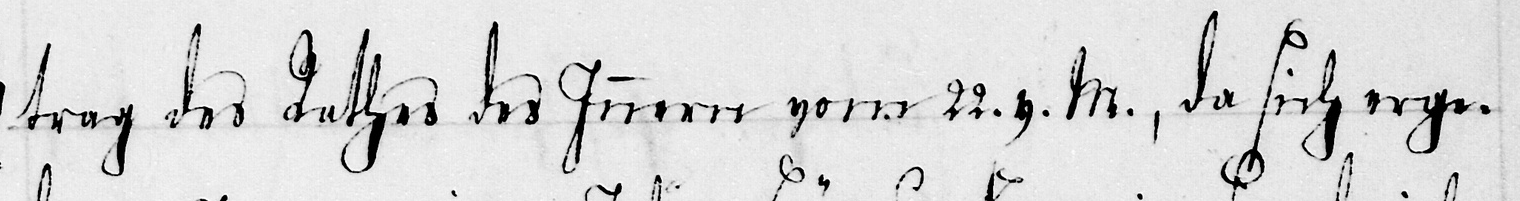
trag des Rathes des Innern vom 22. v. M., da sich erge¬
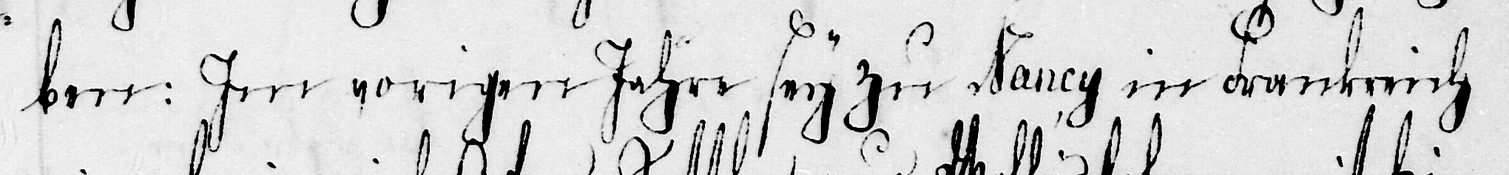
ben: Im vorigen Jahre sey zu Nancy in Frankreich
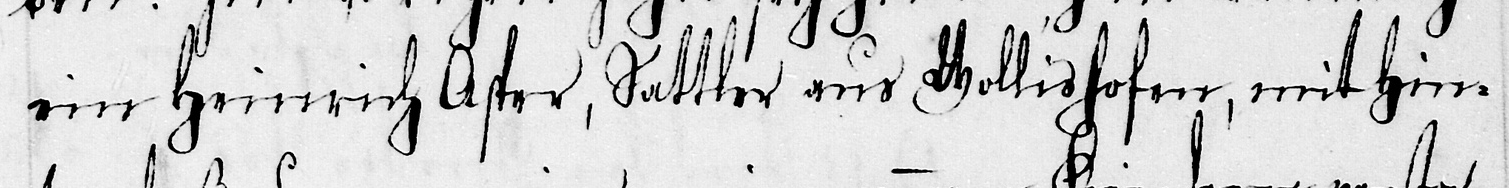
ein Heinrich Asper, Sattler aus Wollishofen, mit Hin¬
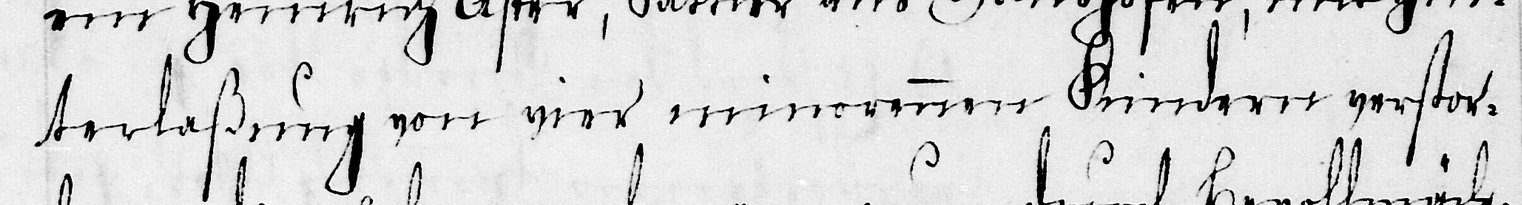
terlaßung von vier minorennen Kindern verstor¬
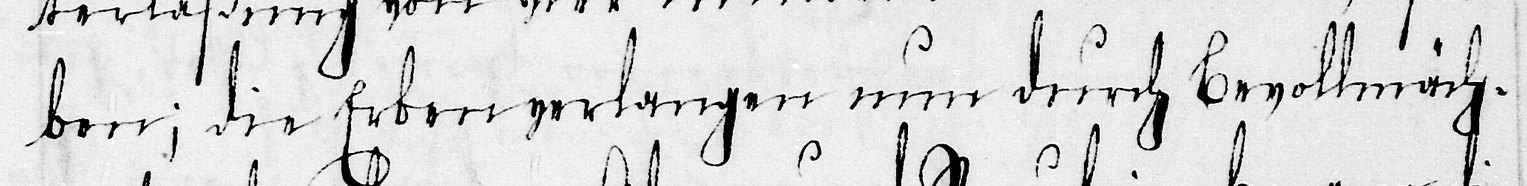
ben; die Erben verlangen nun durch Bevollmäch¬
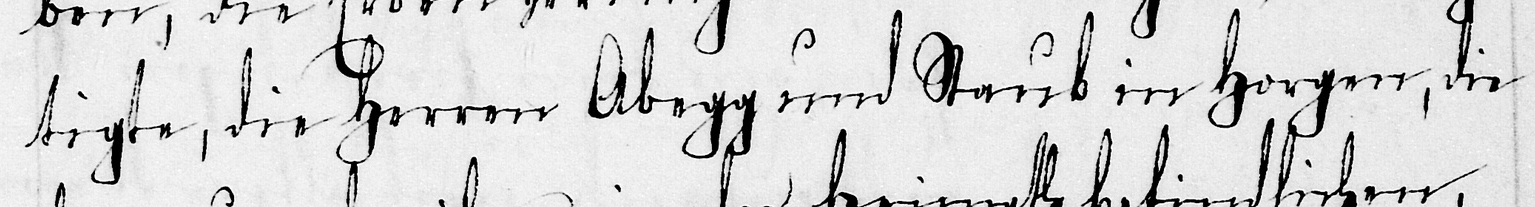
tigte, die Herren Abegg und Staub in Horgen, die
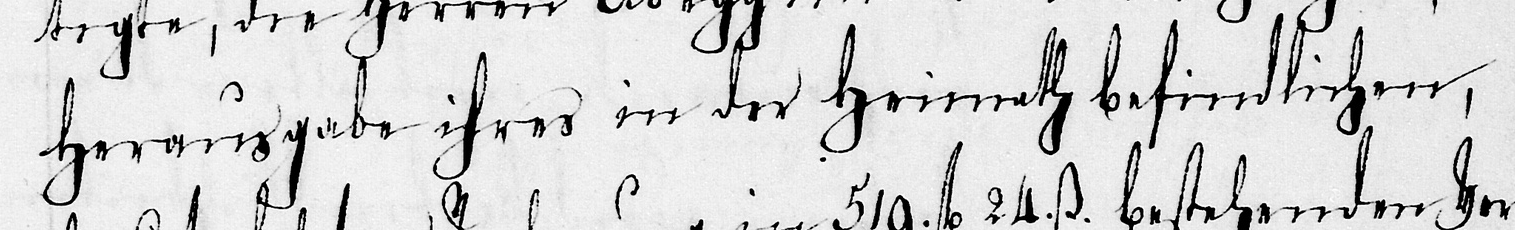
Herausgabe ihres in der Heimath befindlichen,
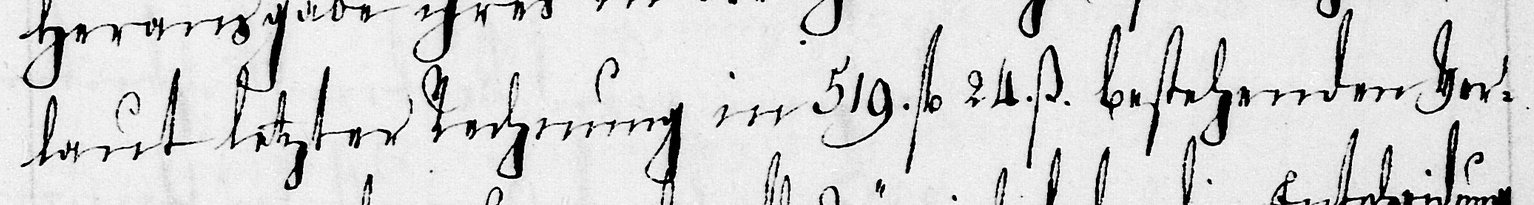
laut letzter Rechnung in 519. fl. 24. ß. bestehenden Ver¬
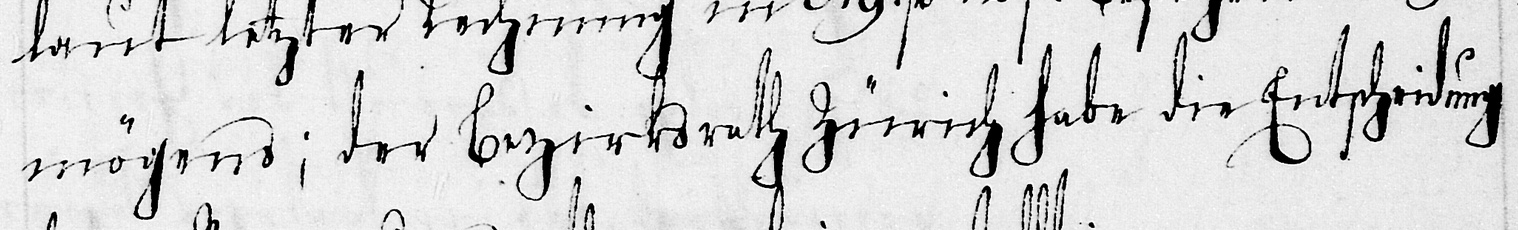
mögens; der Bezirksrath Zürich habe die Entscheidung
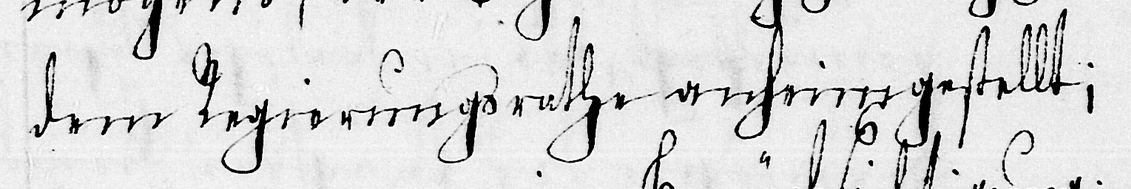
dem Regierungsrathe anheimgestellt;
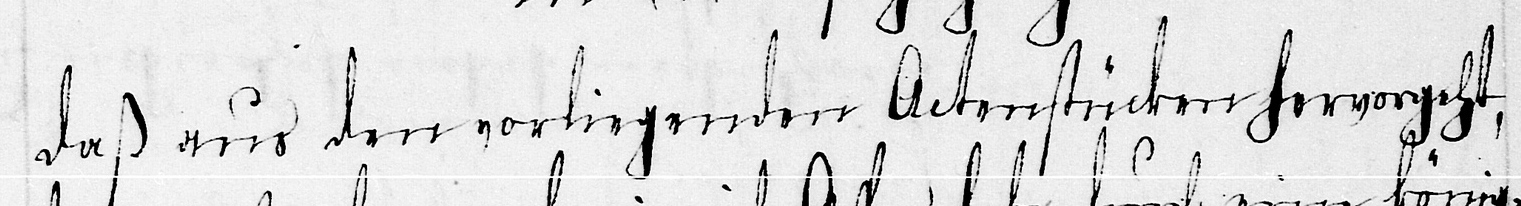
daß aus den vorliegenden Actenstücken hervorgeht,
